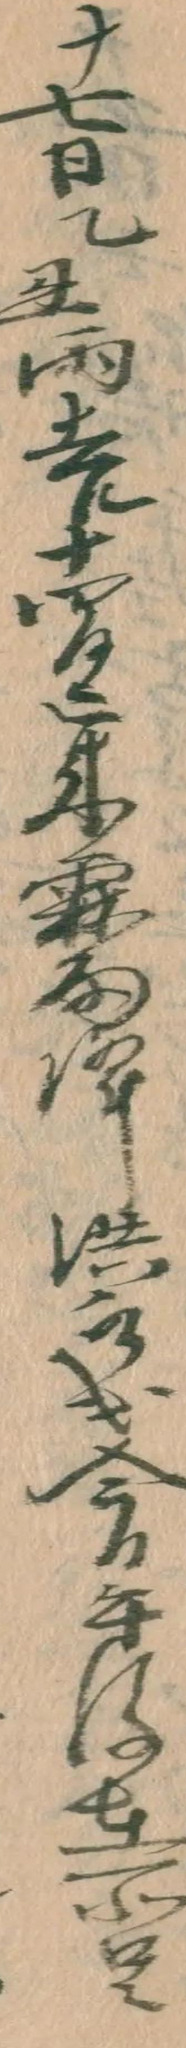十七日乙丑雨去ル十四日已来霖雨降洪水出今日午後在所足
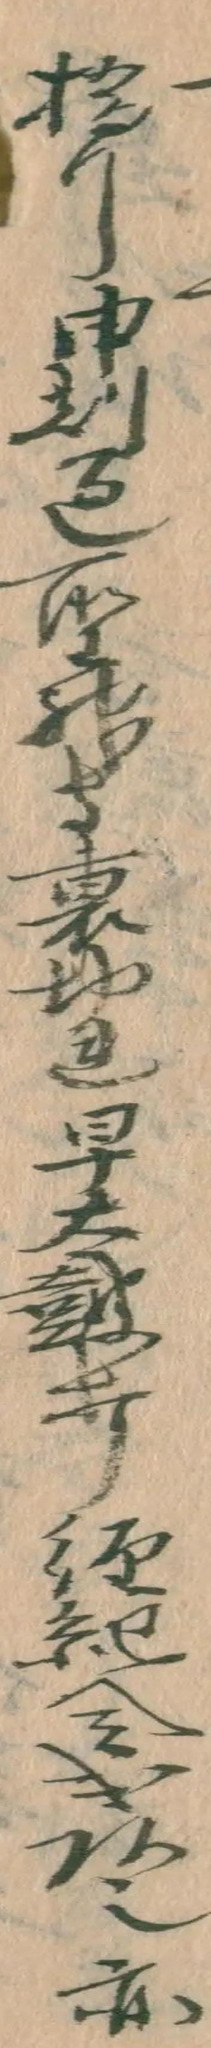橋引申刻過聖神守裏切れ早大皷打経紀令出頭也亦
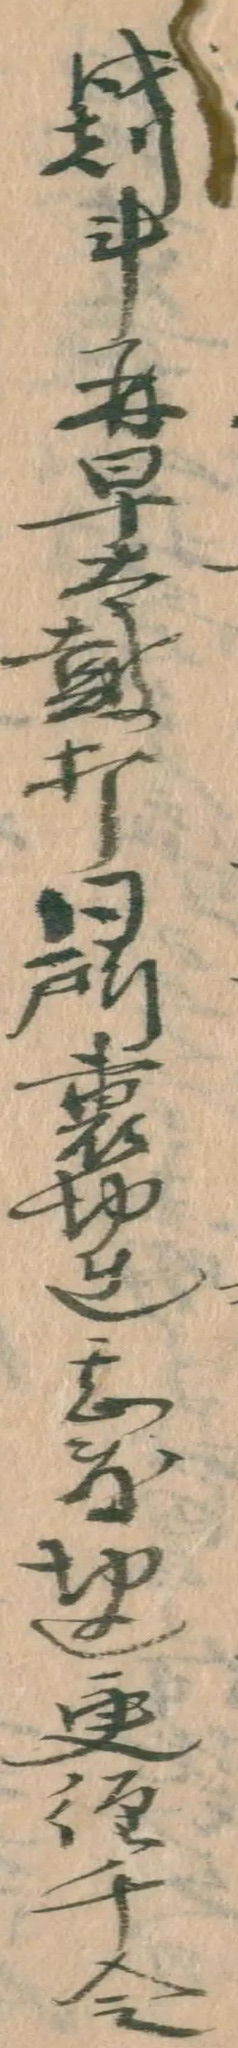戌刻斗再早太皷打同所裏切れ甚敷切れ更経千令
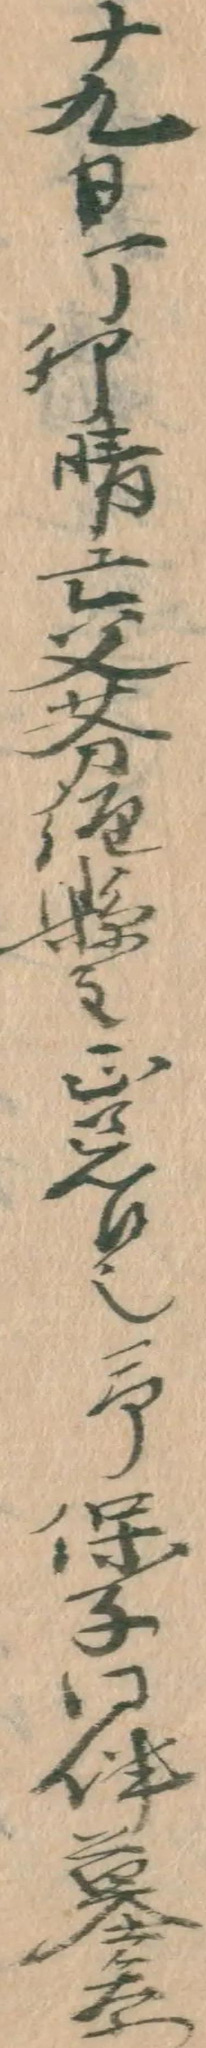十九日丁卯晴亡父芬経縣主正忌日也予保子同伴墓参
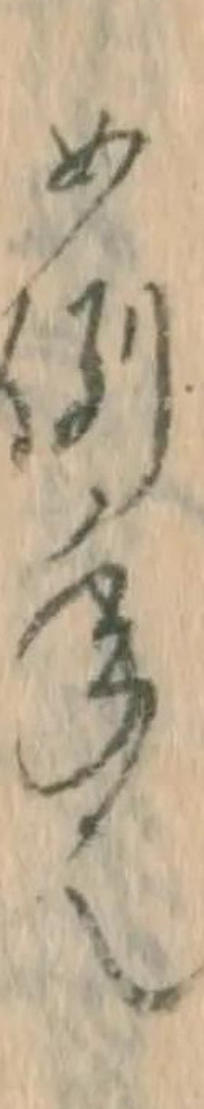如例年也
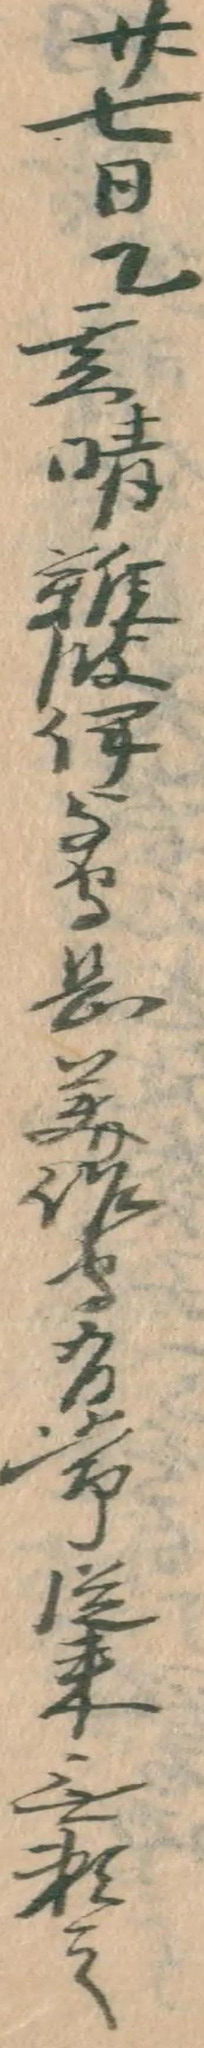廿七日乙亥晴難波伊与守岡美作守有常従来無頼之
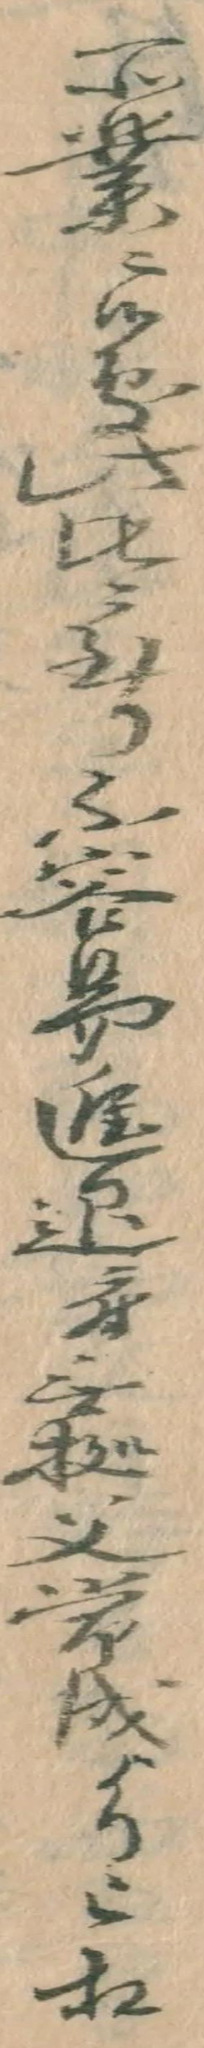所業ニ候處此比ニ至リ不容易進退ニ付無拠又常成より被相
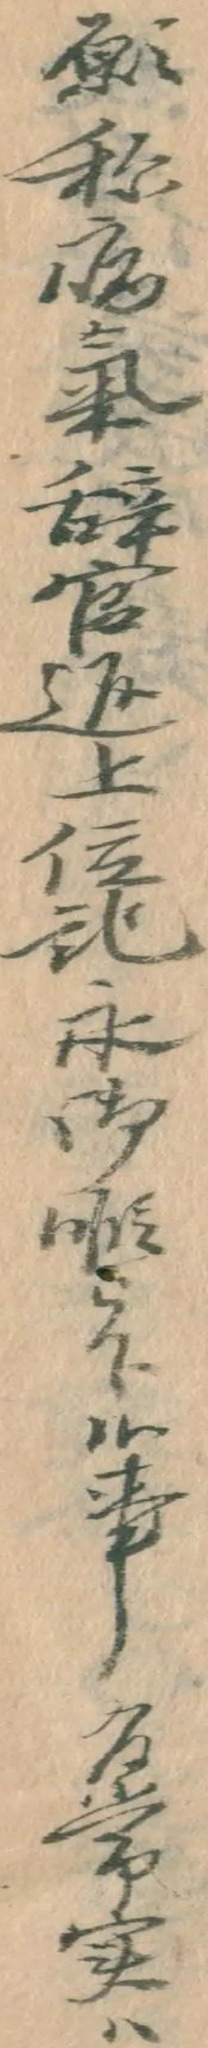願称病氣辞官返上位記永御暇被下候事有常実ハ

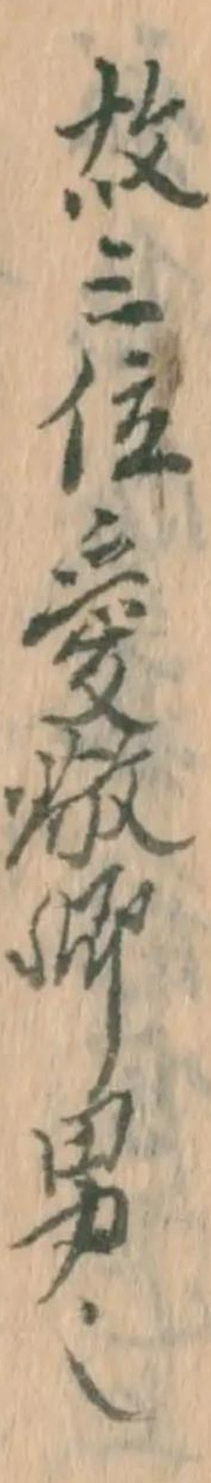故三位愛敬卿男也
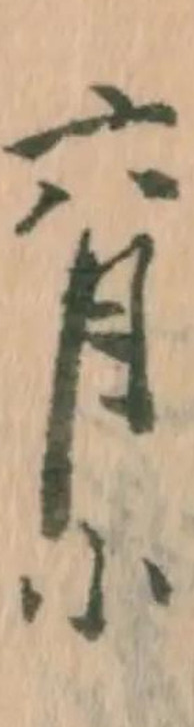六月小
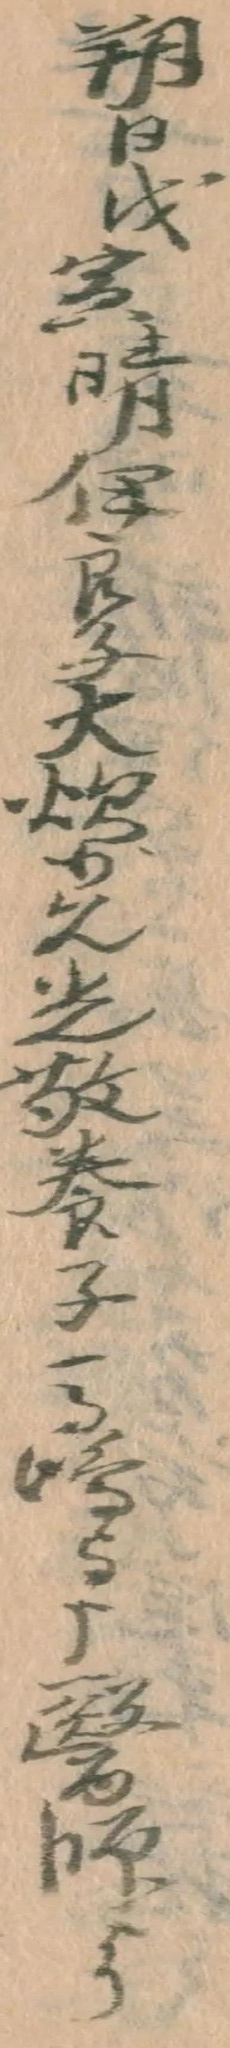朔日戊寅晴伊良子大炊少允光敬養子馬鳴と申醫師より
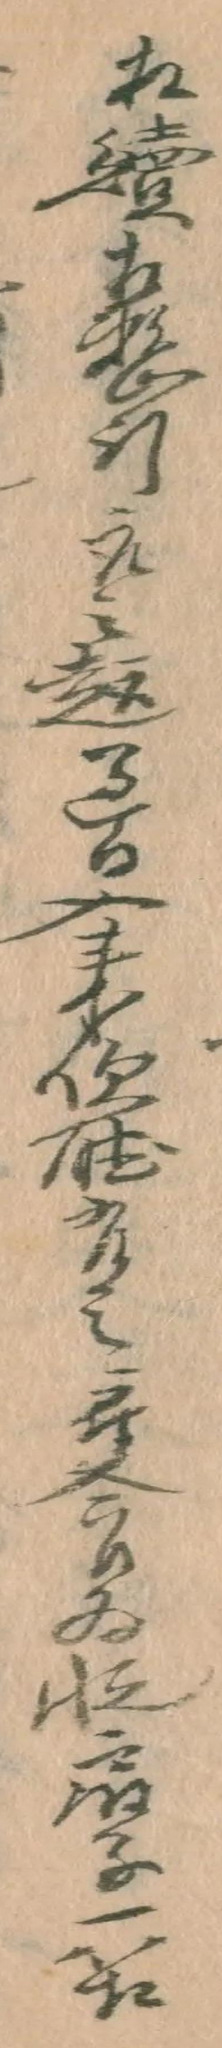相續相整引取之趣過日入来吹聴有之ニ付今日為祝扇子一箱
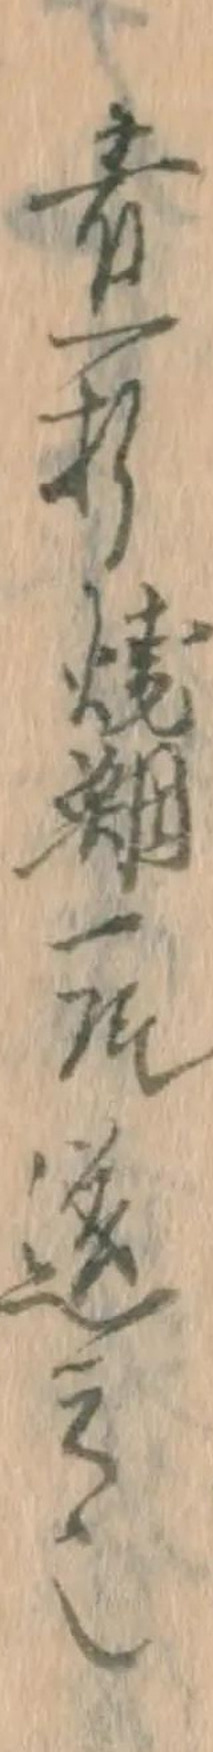肴一折焼鯛一尾送之也
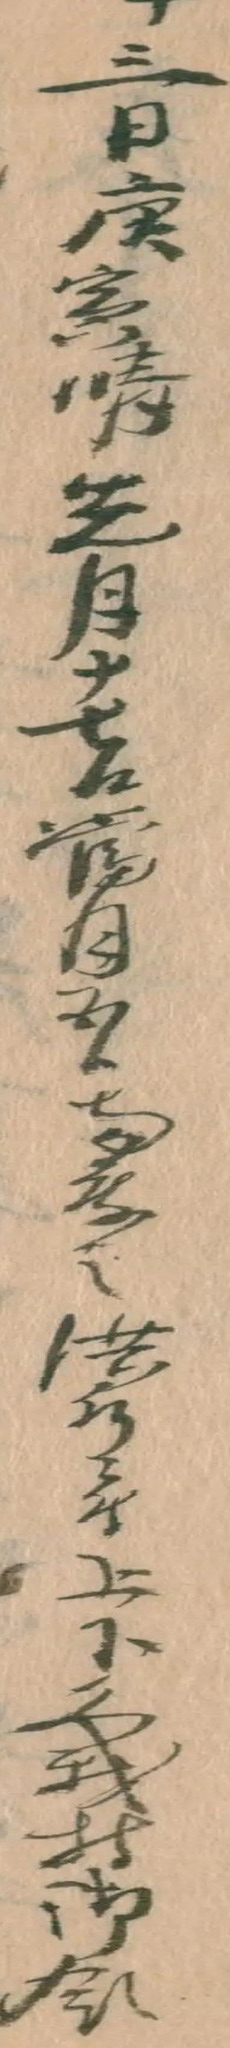十三日庚寅晴先月十七日當月五日両度之洪水ニ付上下久我村御領
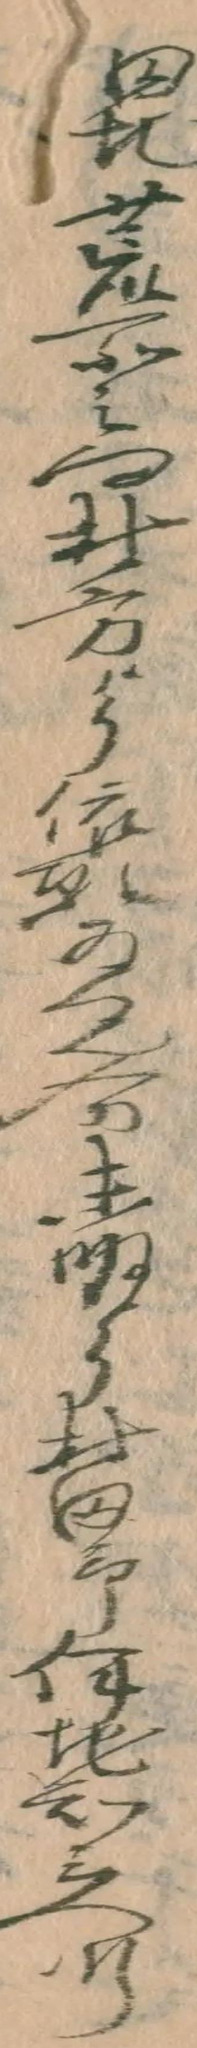田畑荒所之向郷村方より依願為見分未明より村田予伊地知三人行
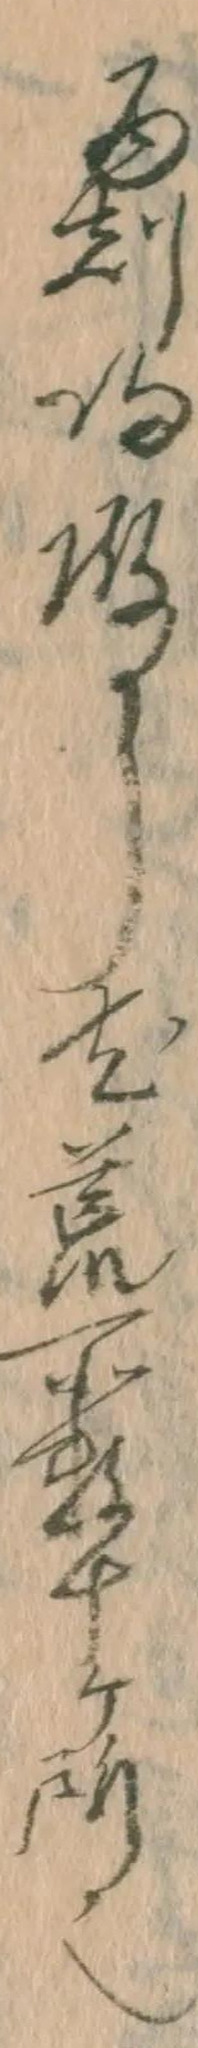酉刻帰殿了尤荒所数十ヶ所也
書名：賀茂社記録. 第69冊
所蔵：国立国会図書館 National Diet Library, JAPAN
